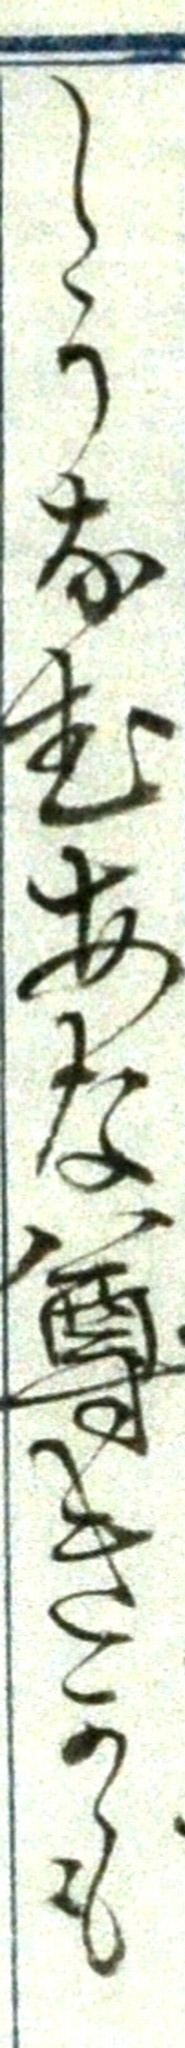しうなむあな尊きかも
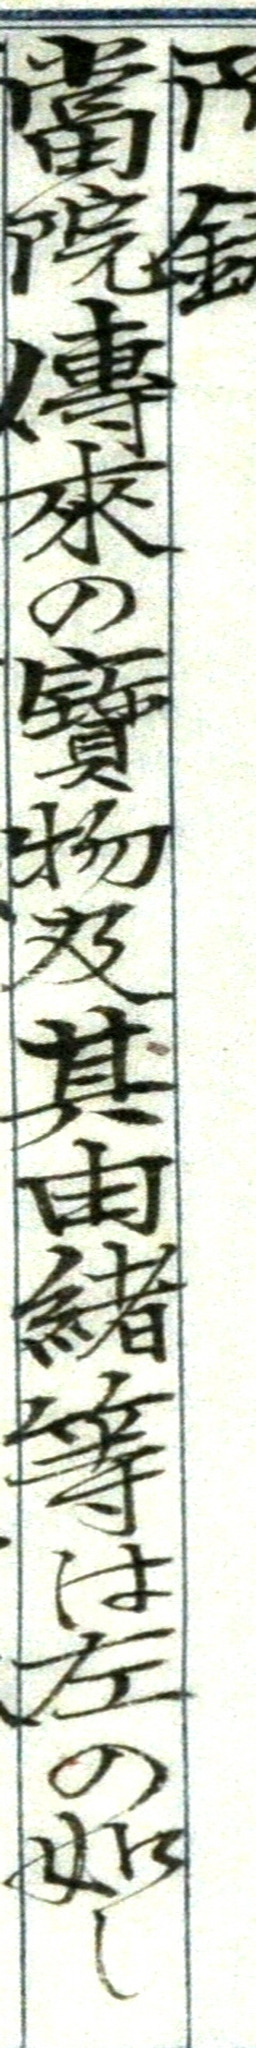当院伝来の宝物及其由緒等は左の如し
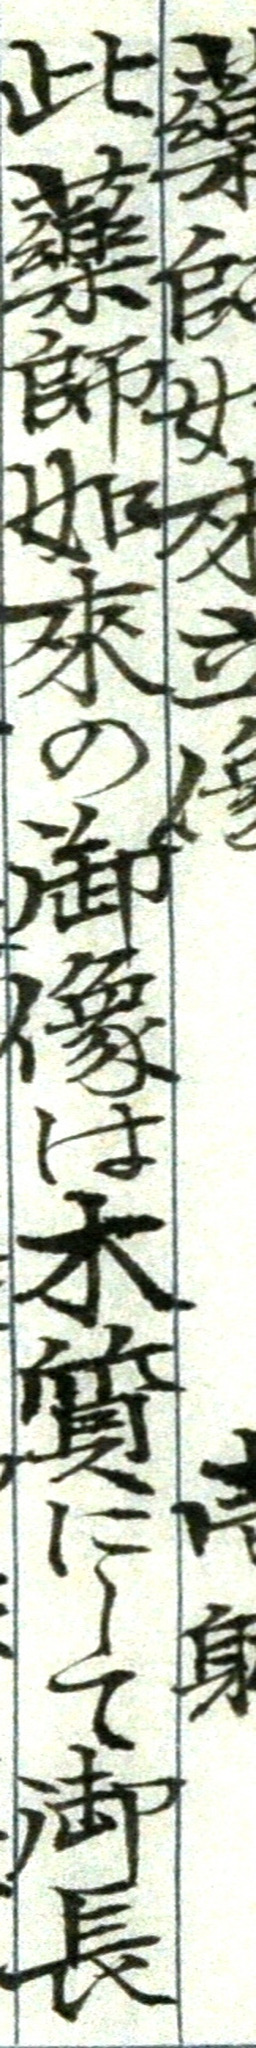是薬師如来の御像は木質にして御長
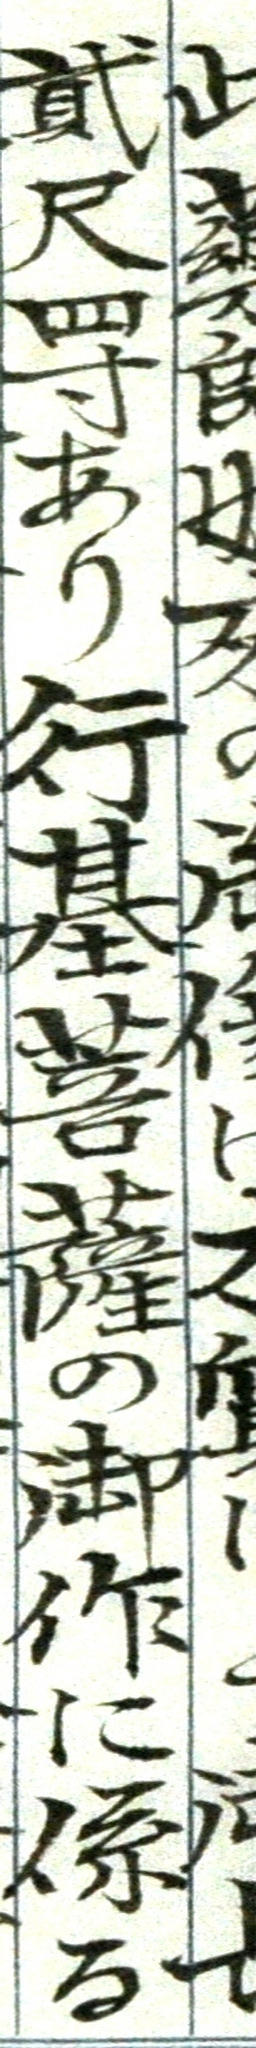弐尺四寸あり行基菩薩の御作に係る
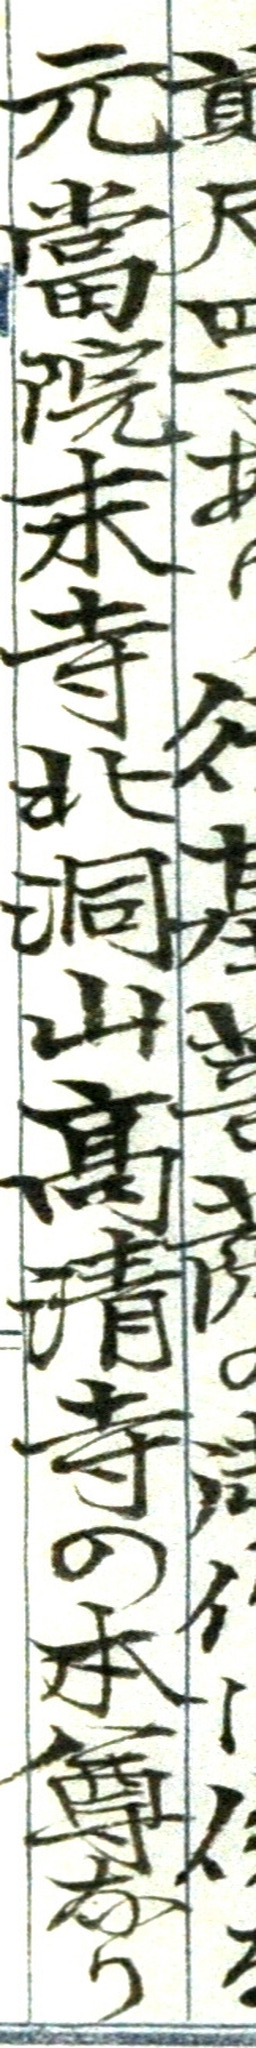元当院末寺北洞山高清寺の本尊なり

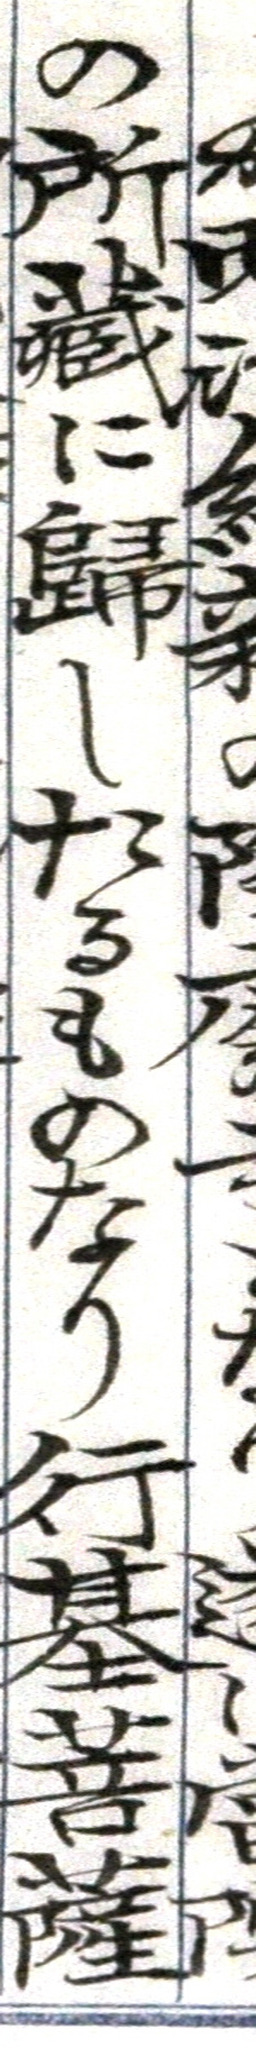の所蔵に帰したるものなり行基菩薩
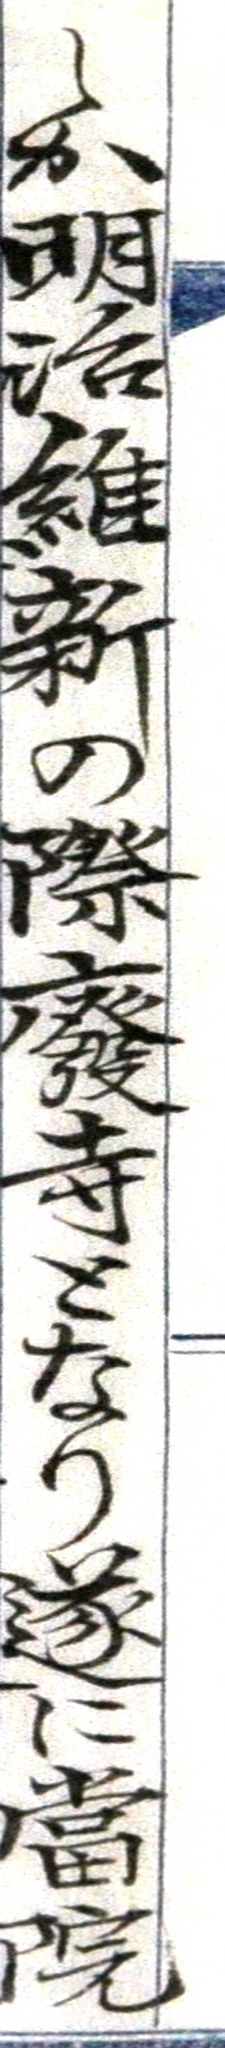しか明治維新の際廃寺となり遂に当院
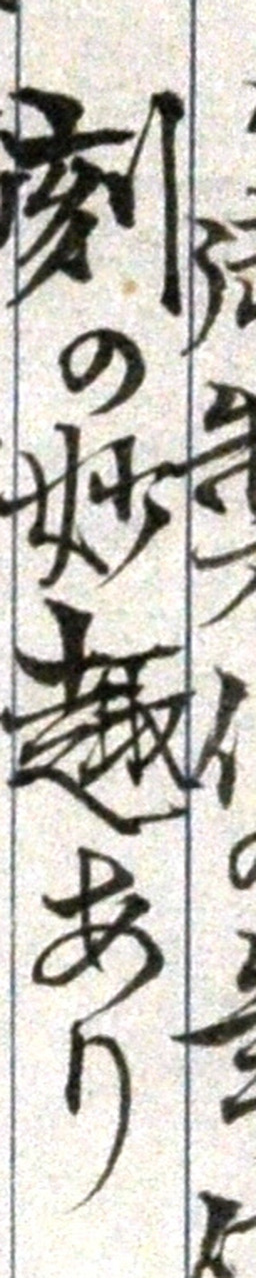刻の妙趣あり
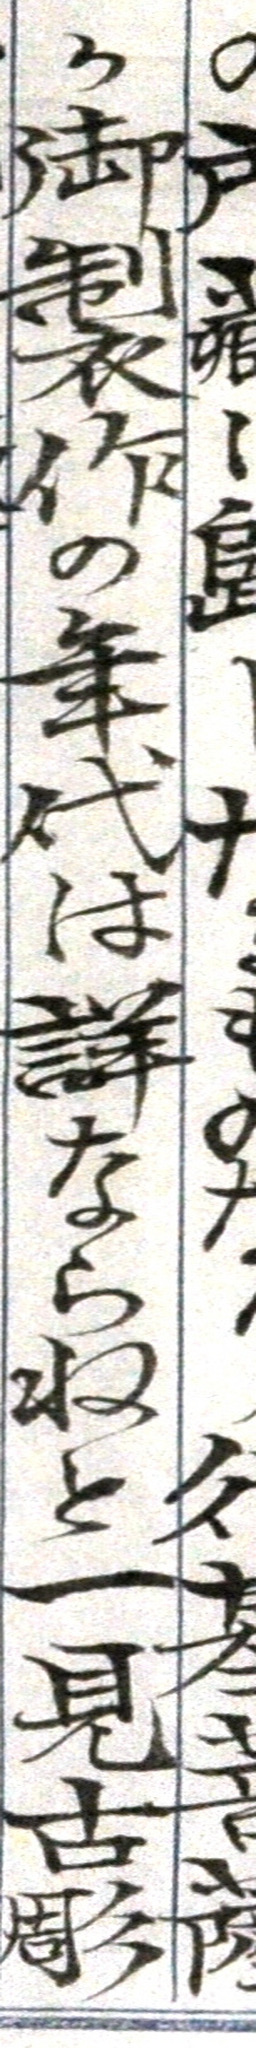か御製作の年代は詳ならねと一見古彫
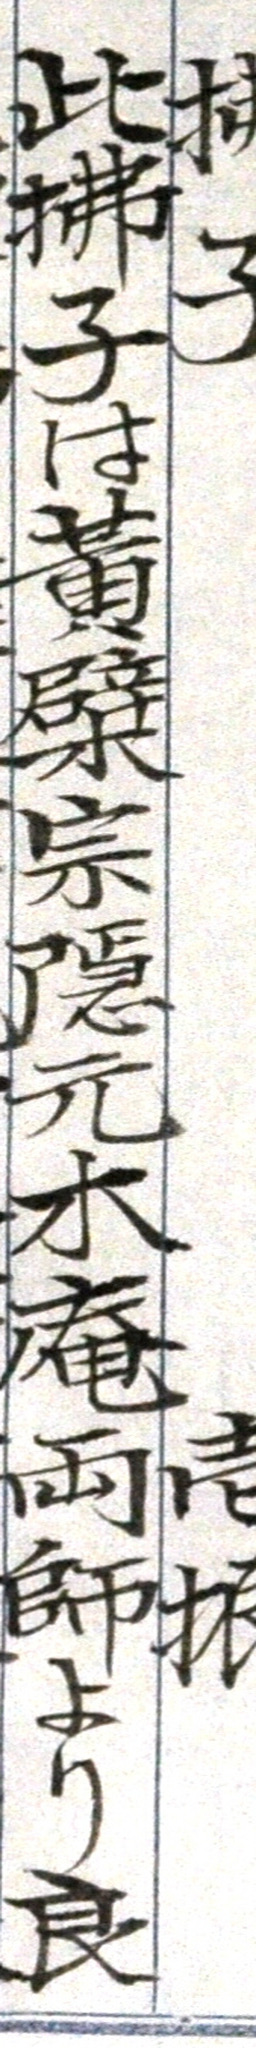此払子は黄檗宗隠元木庵両師より良
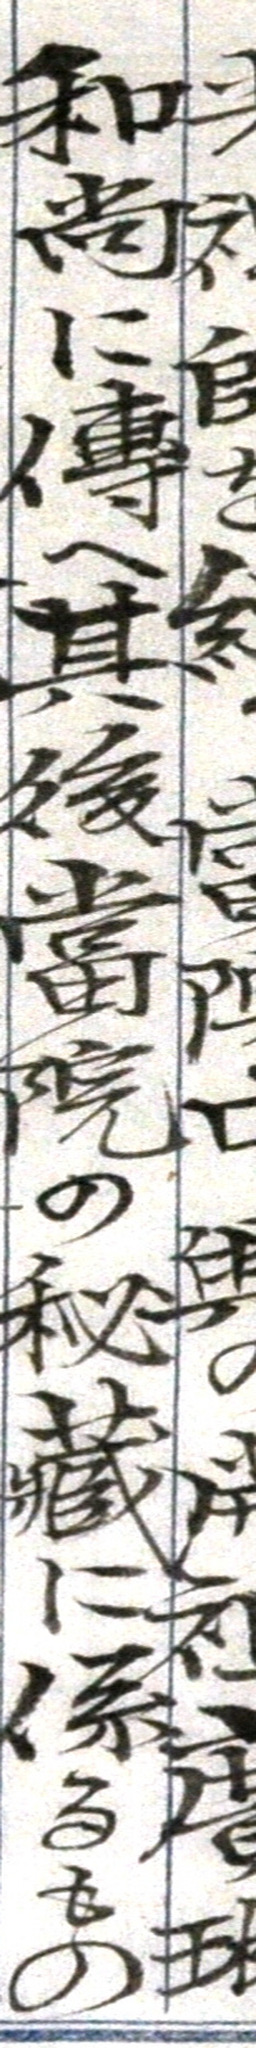和尚に伝へ其後当院の秘蔵に係るもの
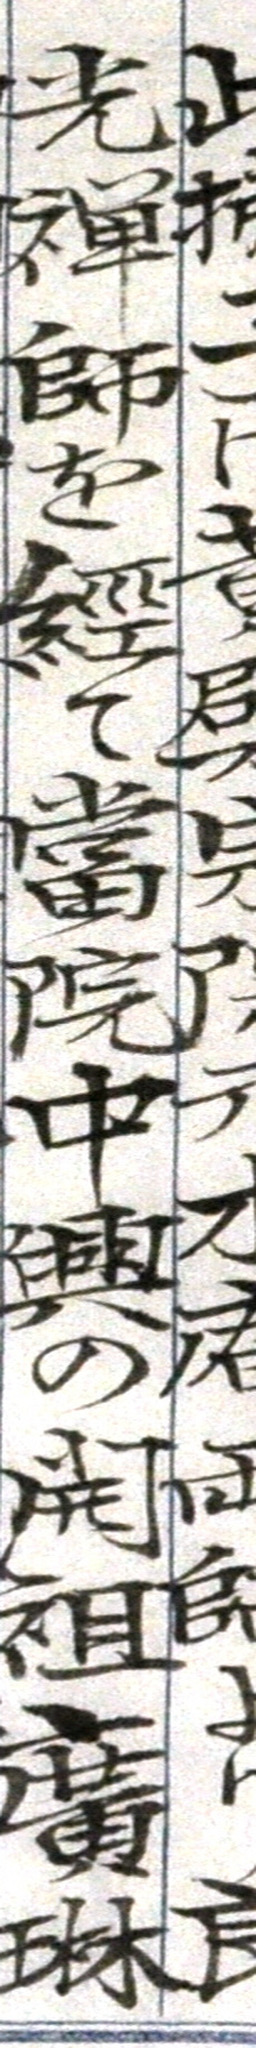光禅師を経て当院中興の開祖広琳
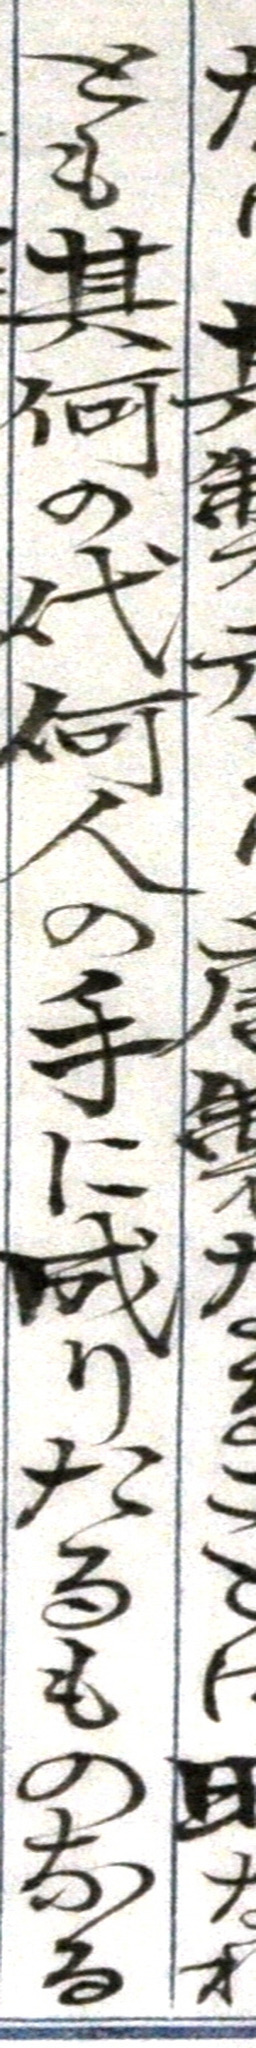とも其何の代何人の手に成りたるものなる
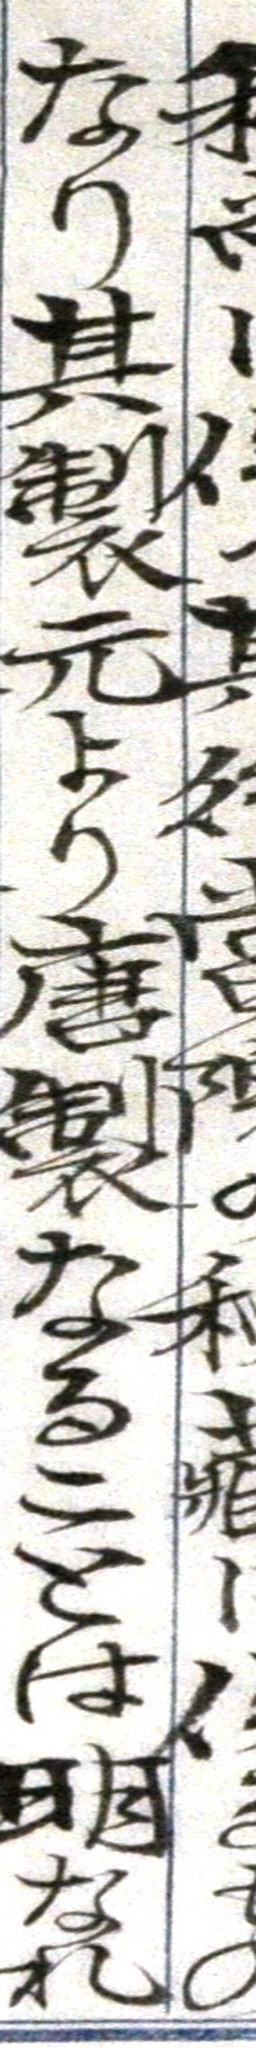なり其製元より唐製造なることは明なれ
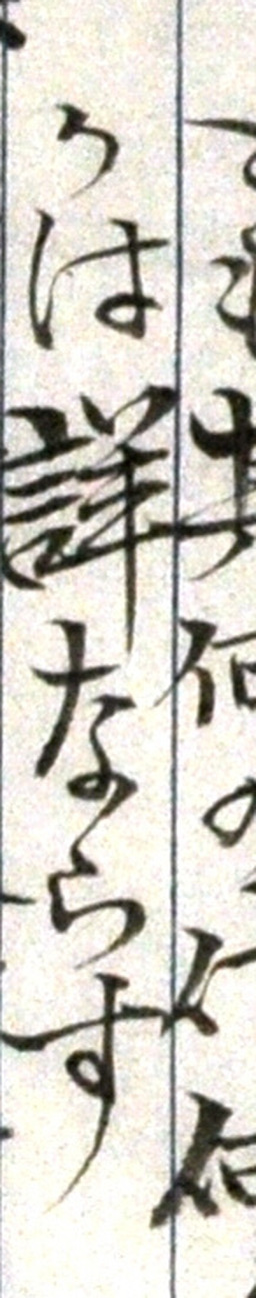かは詳ならす
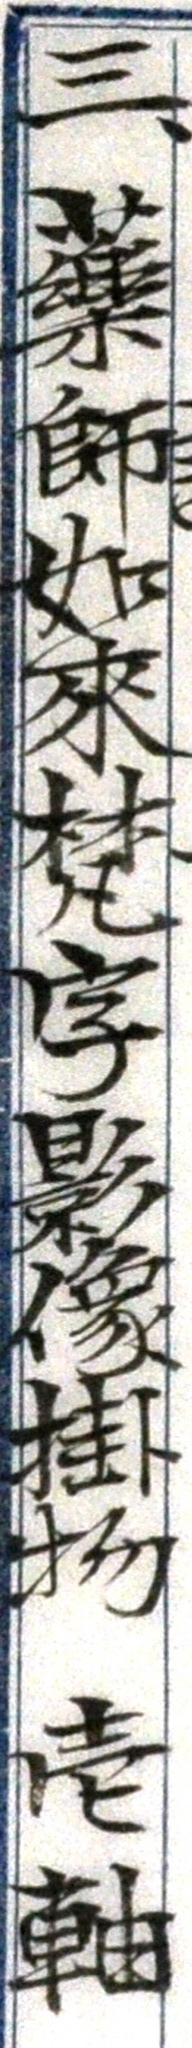三、薬師如来梵字影像掛物壱軸
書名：桂泉院・樹林寺・東光寺縁起書、蓮華寺由来書、付夕顔観音記
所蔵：伊那市立高遠町図書館・合同会社AMANE
